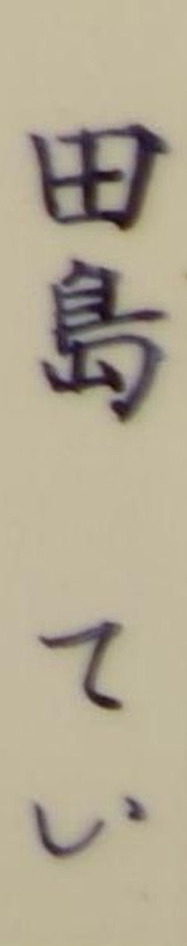田島てい
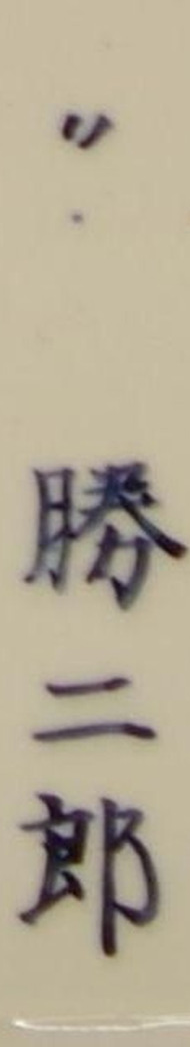勝二郎
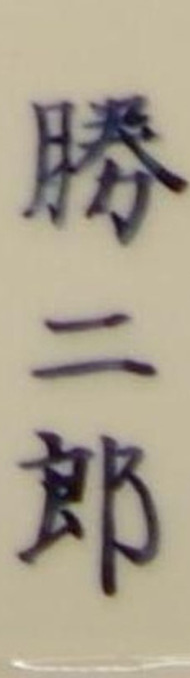勝二郎
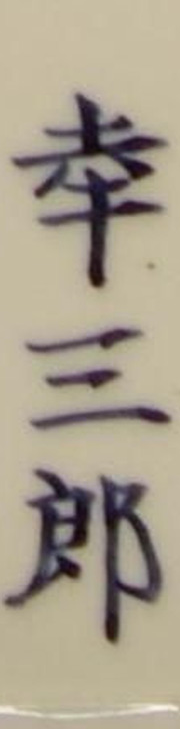幸三郎
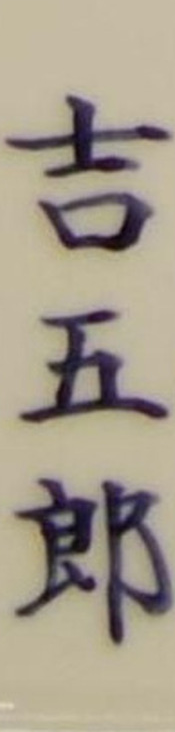吉五郎

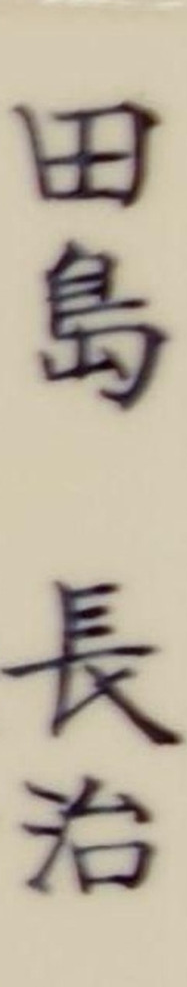田島長治
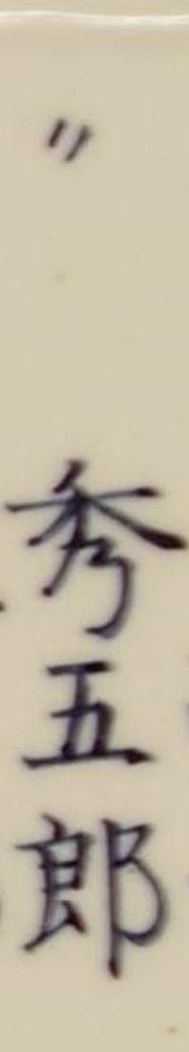秀五郎
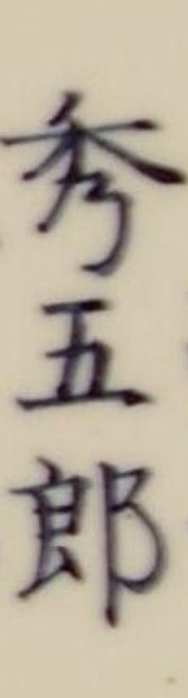秀五郎
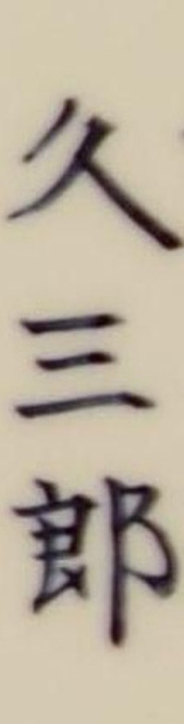久三郎
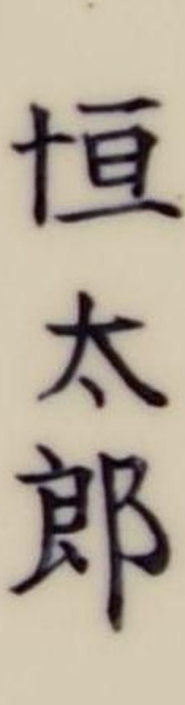恒太郎
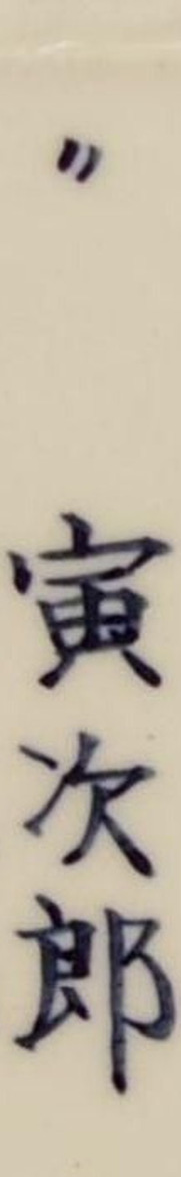寅太郎
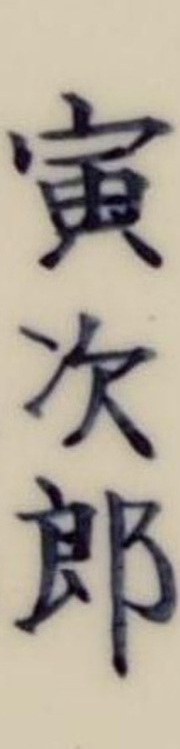寅太郎
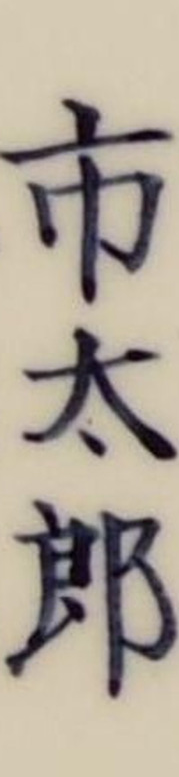市太郎
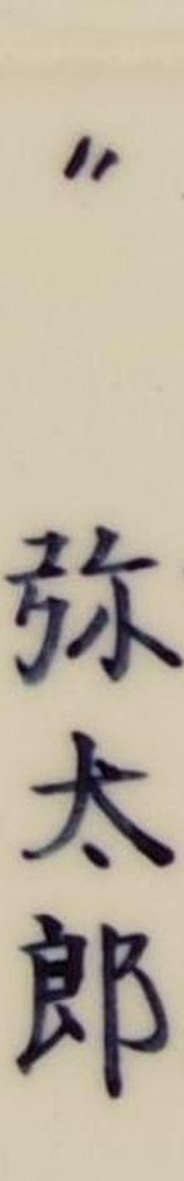弥太郎
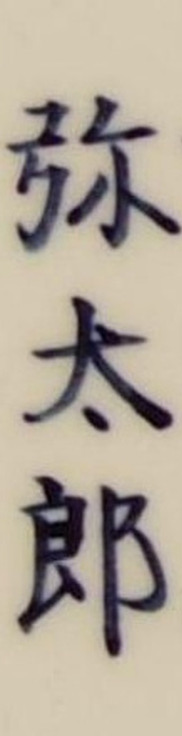弥太郎
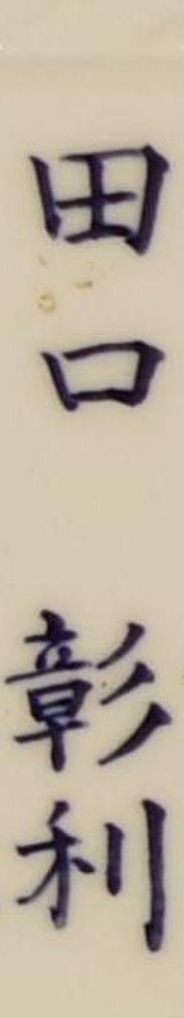田口彰利
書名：A~D
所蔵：koyasan kongobuji
